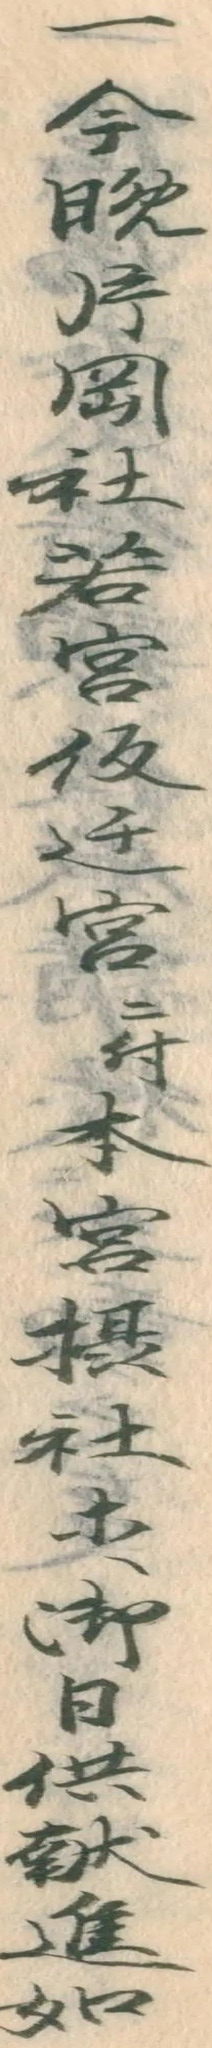一今晩片岡社若宮仮迁宮ニ付本宮摂社等へ御日供献進如
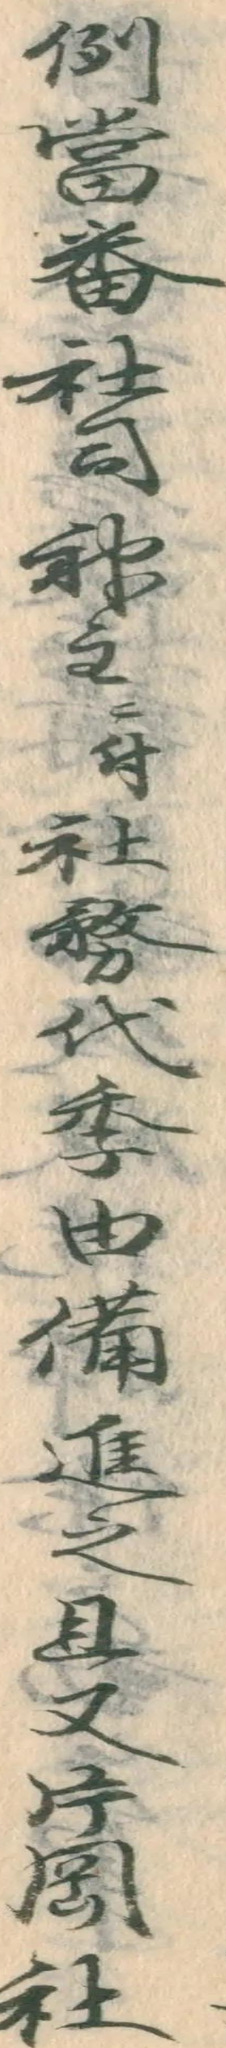例当番社司神主ニ付社務代季由備進之且又片岡社
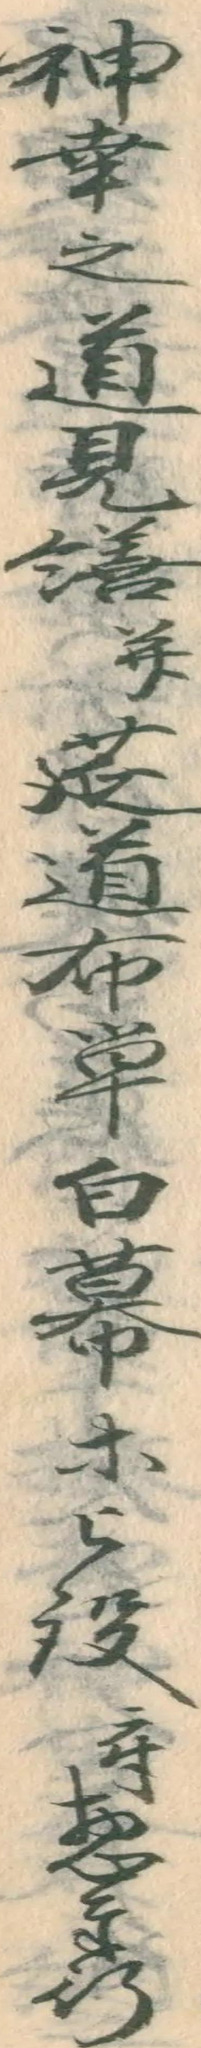神幸之道見繕并筵道布単白幕等被設ニ付惣奉行

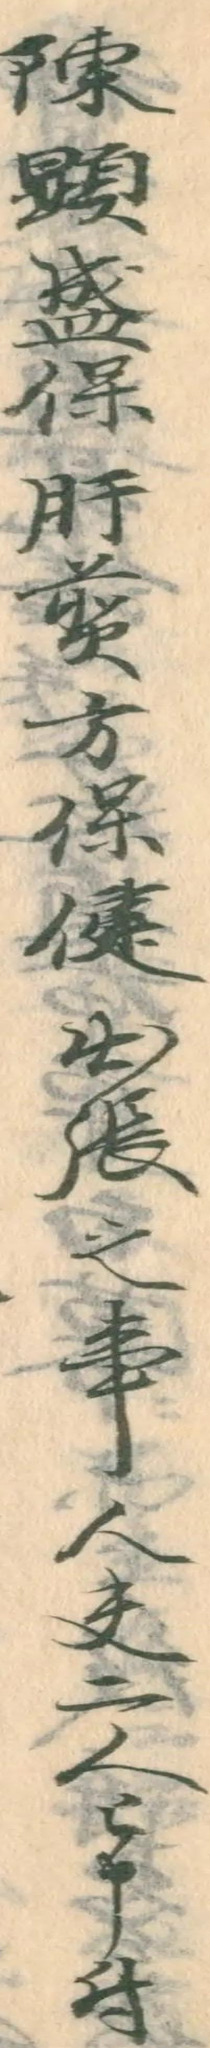陳顕盛保肝煎方保健出張之事人夫二人被申付
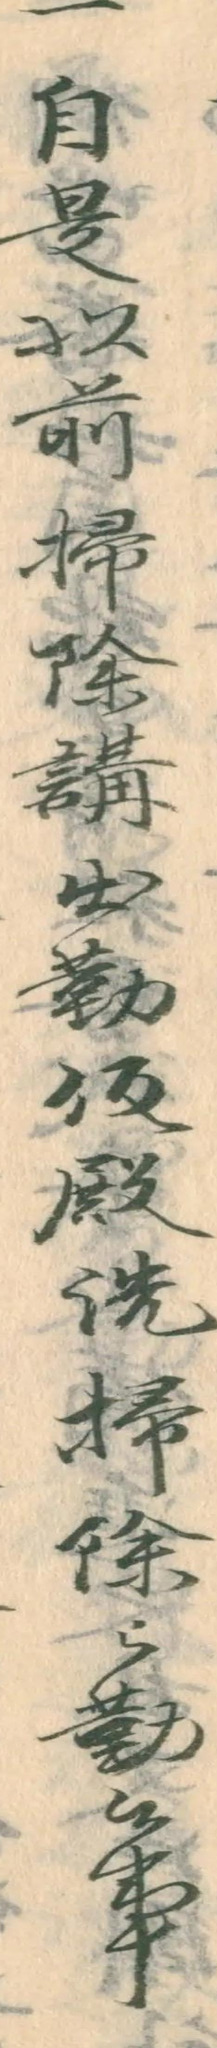一自是以前掃除講出勤仮殿洗掃除被勤候事
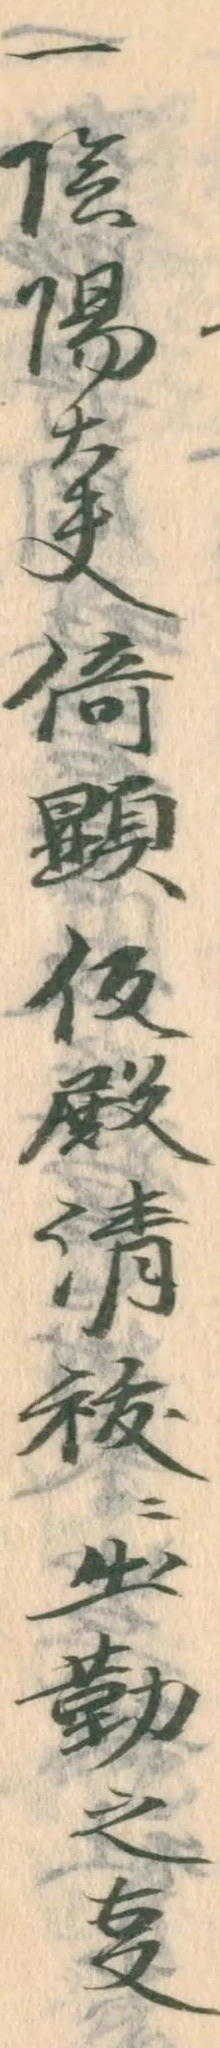一陰陽大夫倚顕仮殿清祓ニ出勤之事
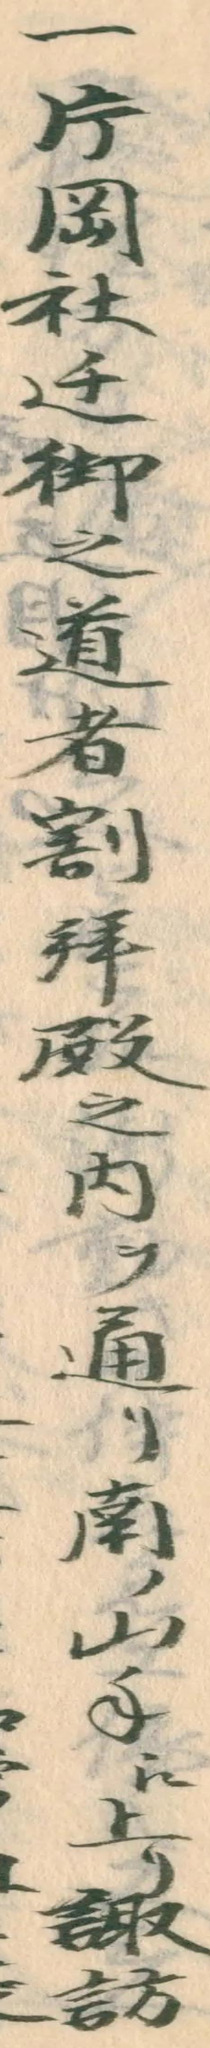一片岡社迁御之道は割拝殿之内ヲ通リ南ノ山手江上リ諏訪
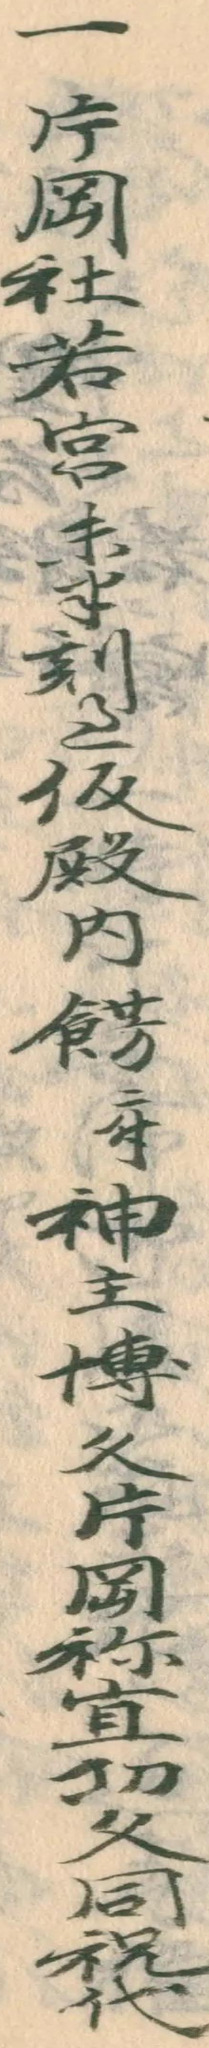一片岡社若宮未半刻過仮殿内錺ニ付神主博久片岡祢宜功久同祝代
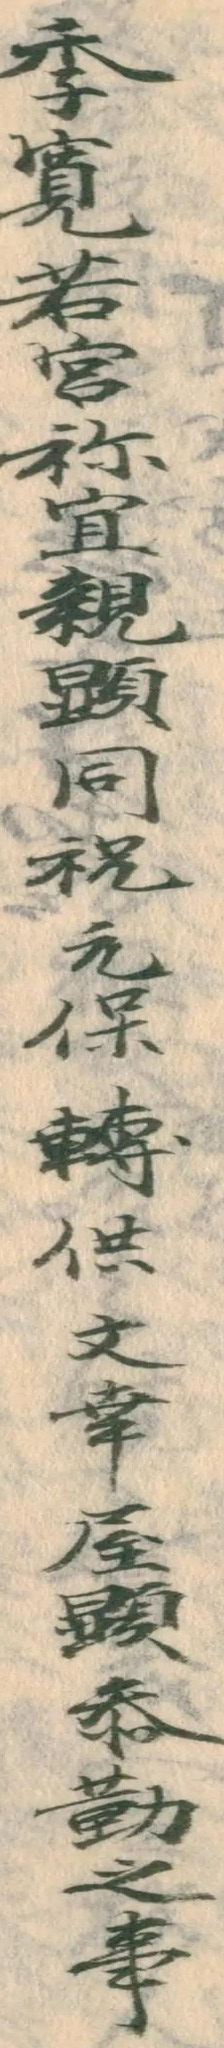季寛若宮祢宜親顕同祝元保転供文幸屋顕参勤之事
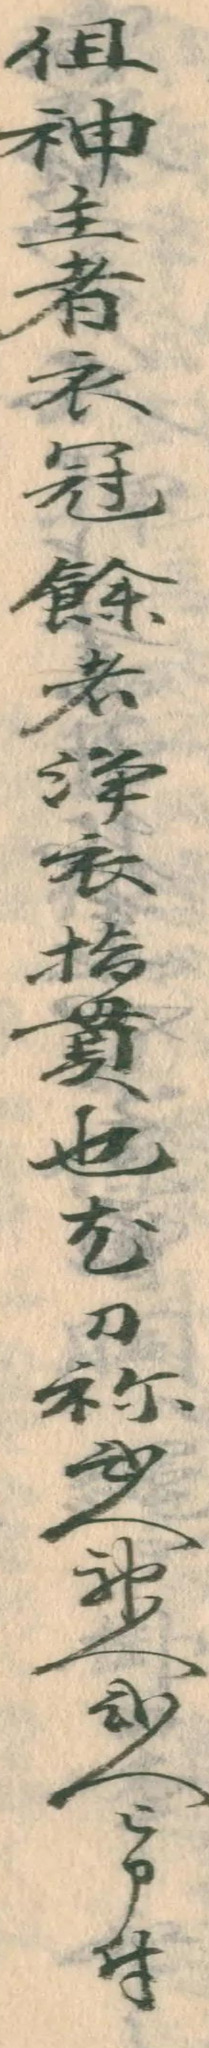但神主は衣冠余は浄衣指貫也尤刀祢弐人神人弐人被申付
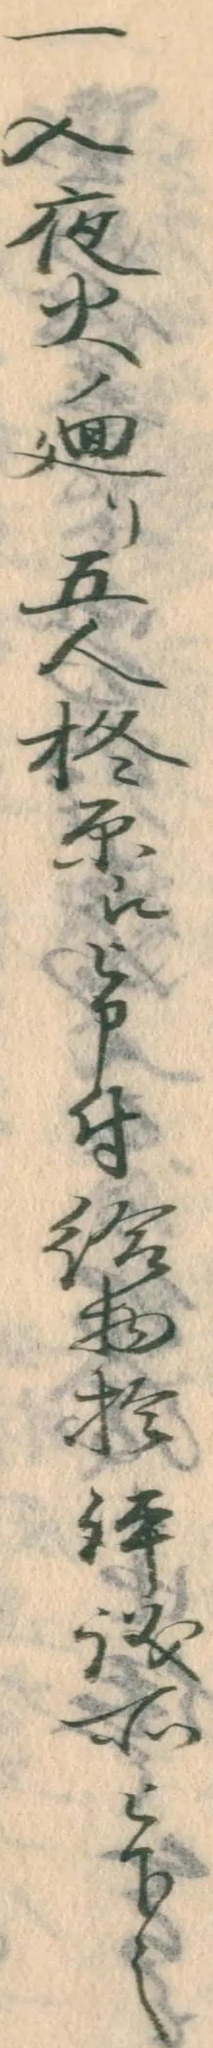一入夜火ノ廻リ五人柊原江被申付給物於評議所被下之
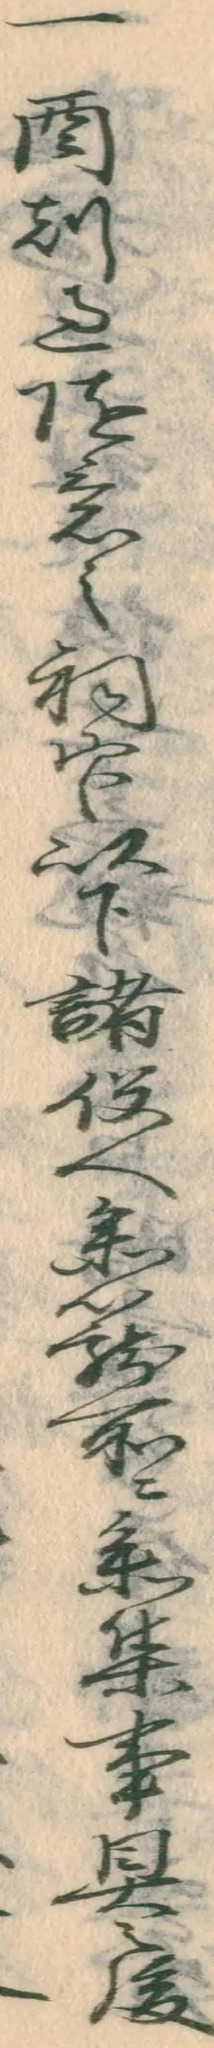一酉刻過随意之祠官以下諸役人参籠所ニ参集事具之後
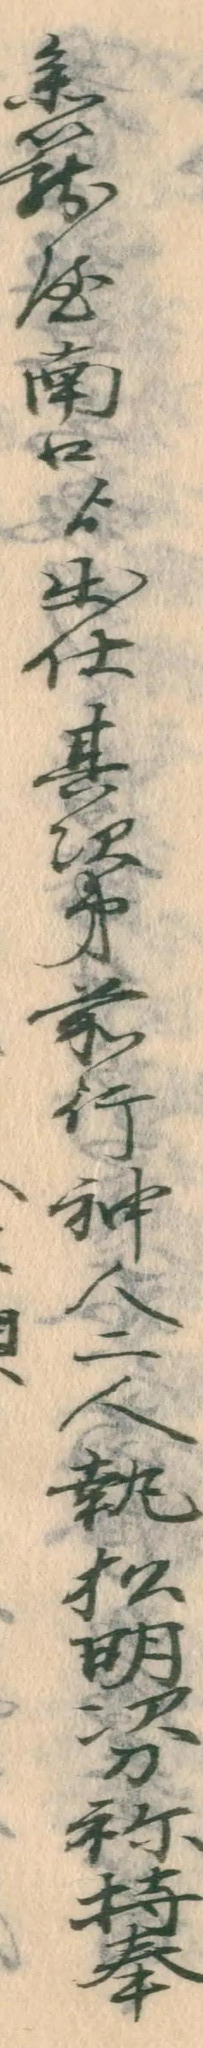参籠屋南口ゟ出仕其次第前行神人二人執松明次刀祢持奉
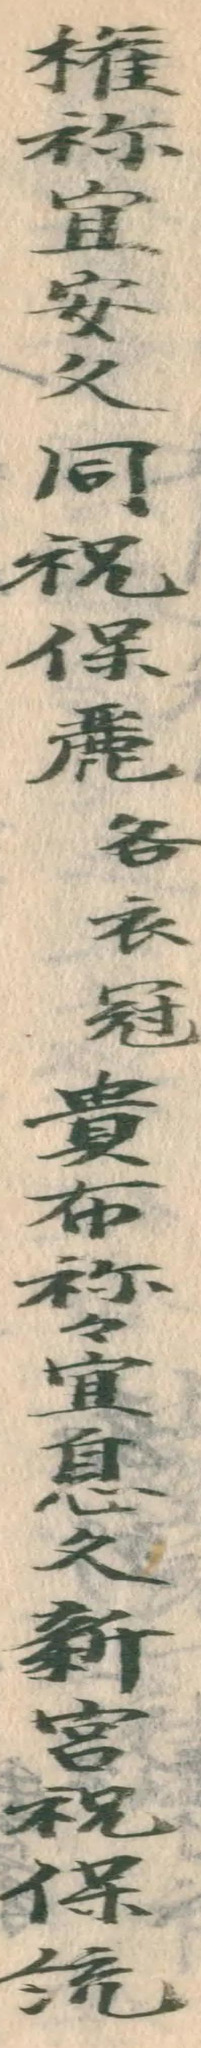権祢宜安久同祝保麗各衣冠貴布祢々宜息久新宮祝保統
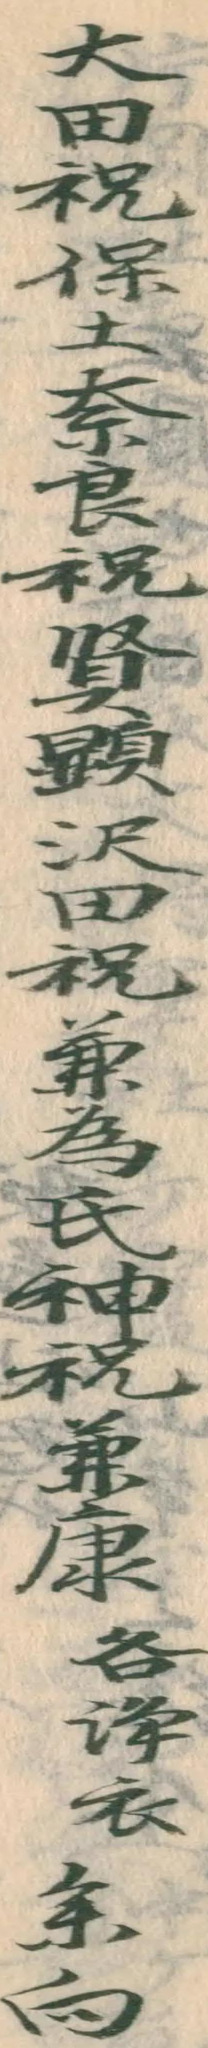大田祝保土奈良祝賢顕沢田祝兼為氏神祝兼康各浄衣参向
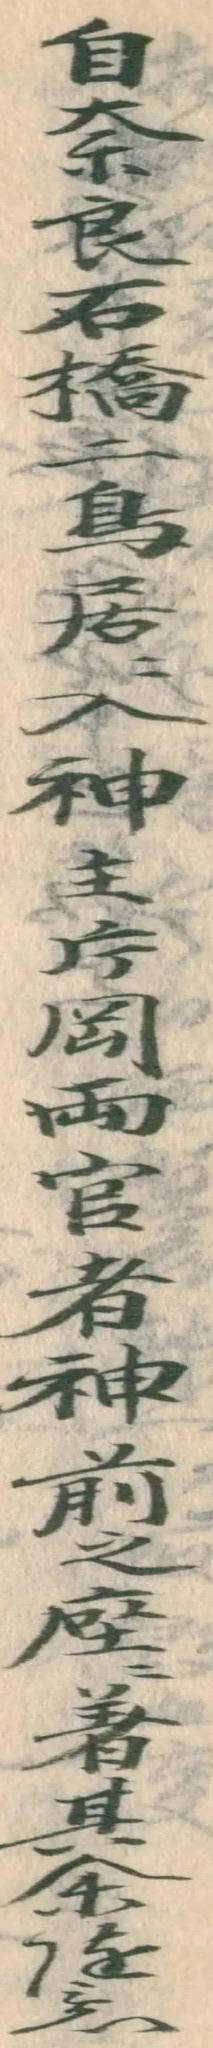自奈良石橋二鳥居ニ入神主片岡両官は神前之座ニ着其余随意
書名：賀茂社記録. 第17冊
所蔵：国立国会図書館 National Diet Library, JAPAN
